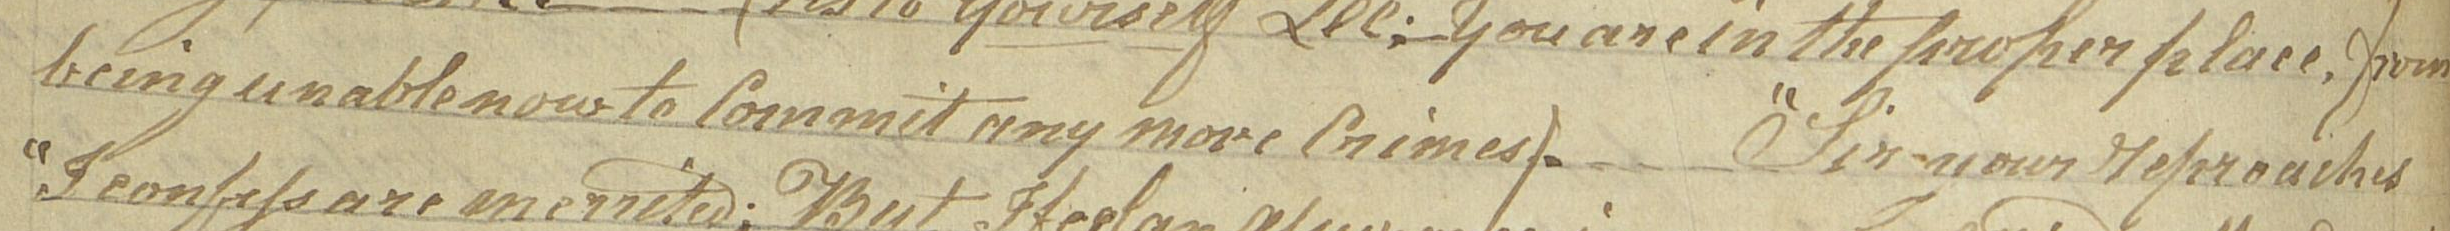being unable now to Commit any more Crimes). "Sir your reproaches
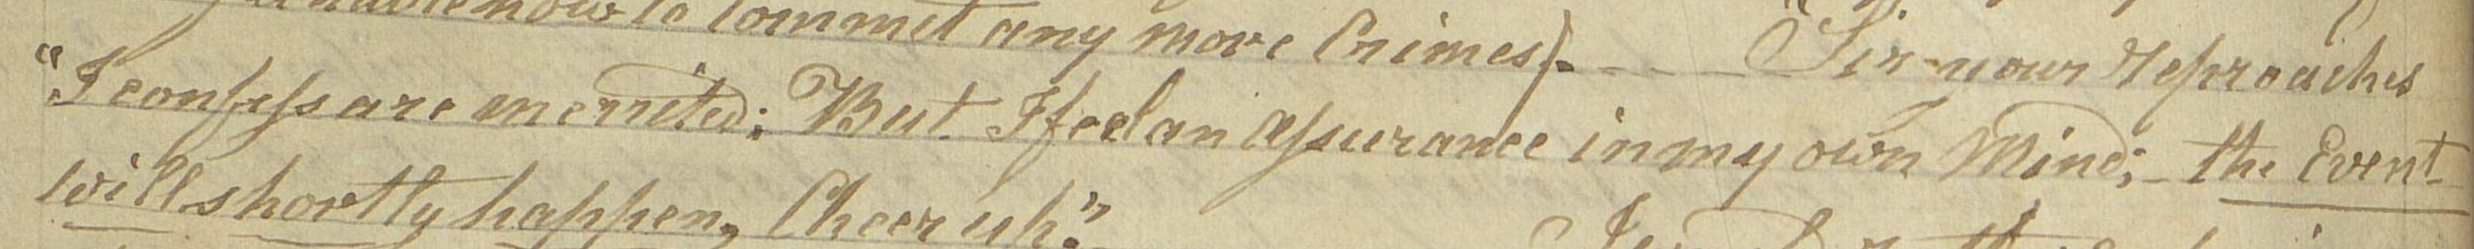"I confess are merrited: But I feel an assurance in my own Mind; the Event
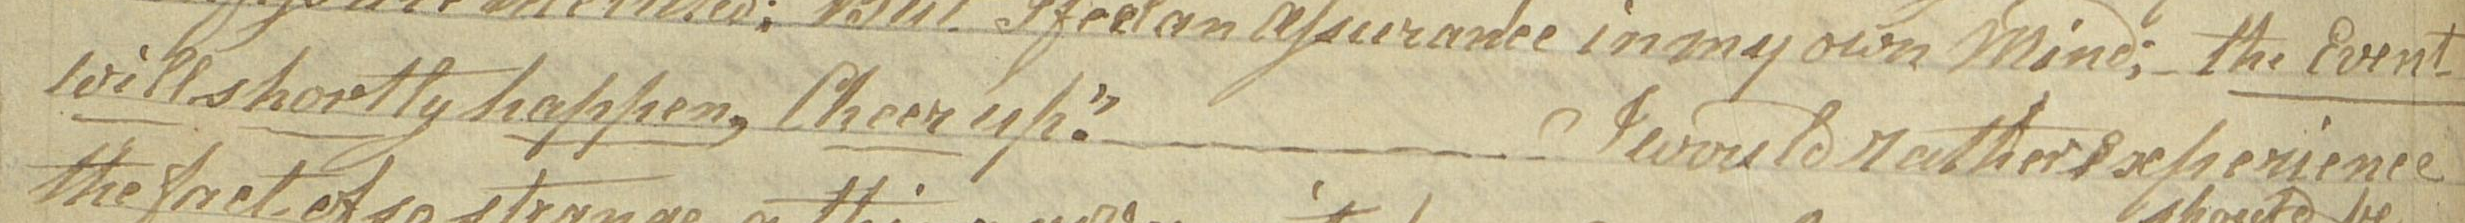will shortly happen, Cheer up." I would rather experience
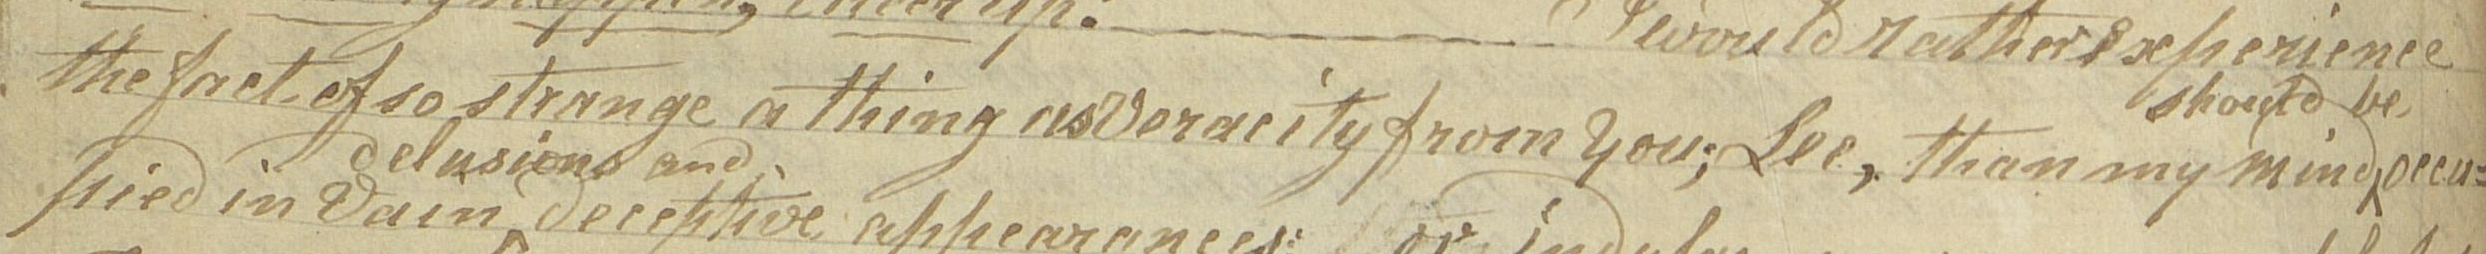the fact of so strange a thing as veracity from you; Lee, than my mind ^ occu-
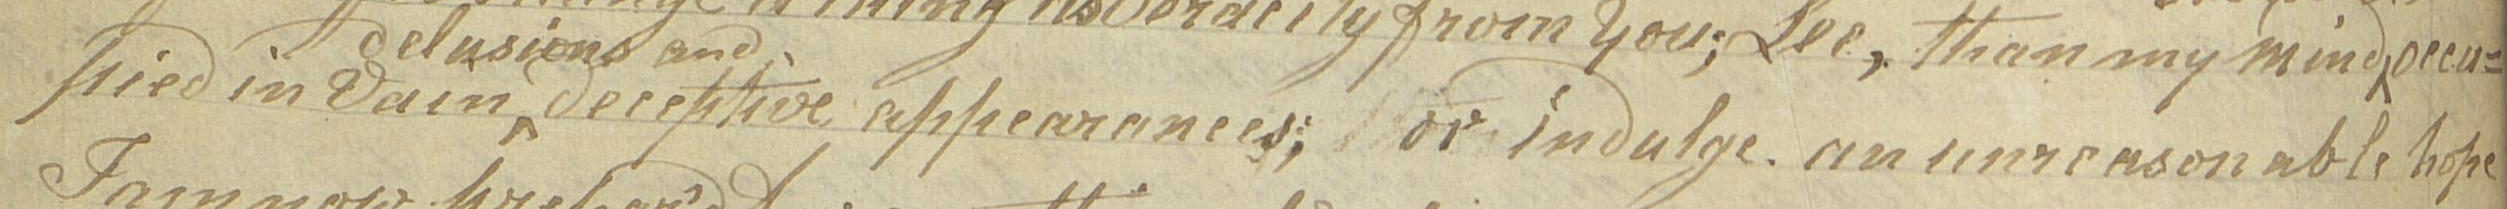tried in Vain ^ deceptive appearances; or indulge an unreasonable hope
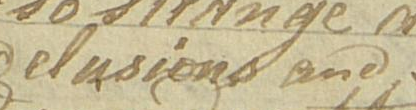elusions and
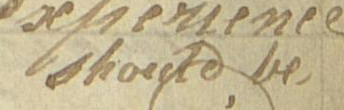should be
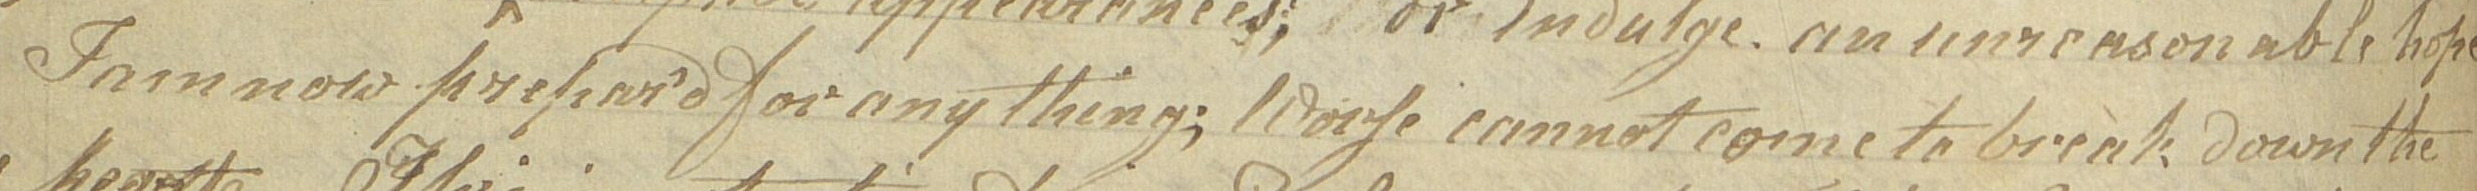I am now prepar'd for any thing; Worse cannot come to break down the
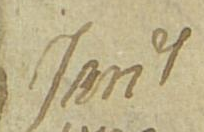Jan^y
